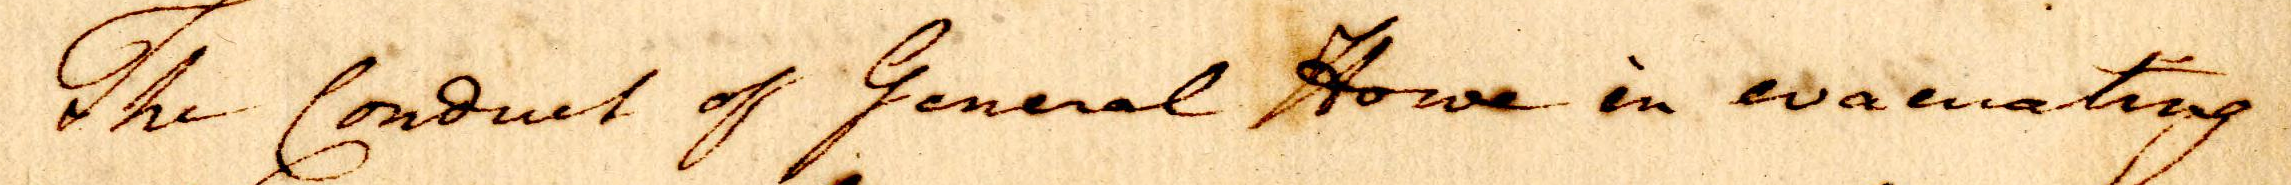The Conduct of General Howe in evacuating
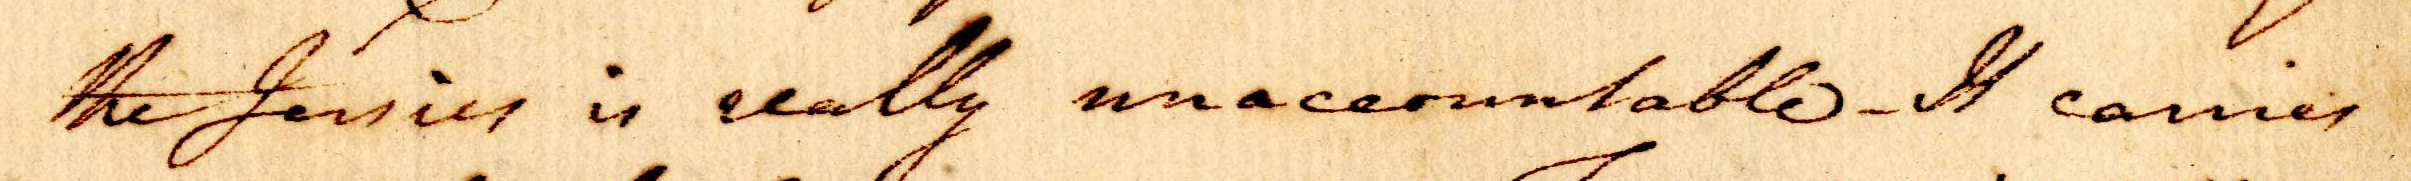the Jersies is really unaccountable. It carries
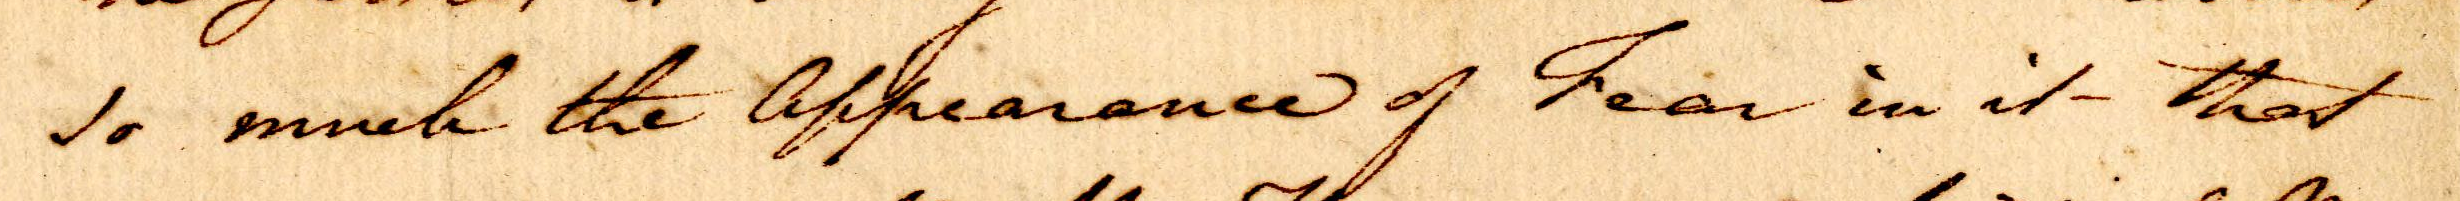so much the Appearance of Fear in it that
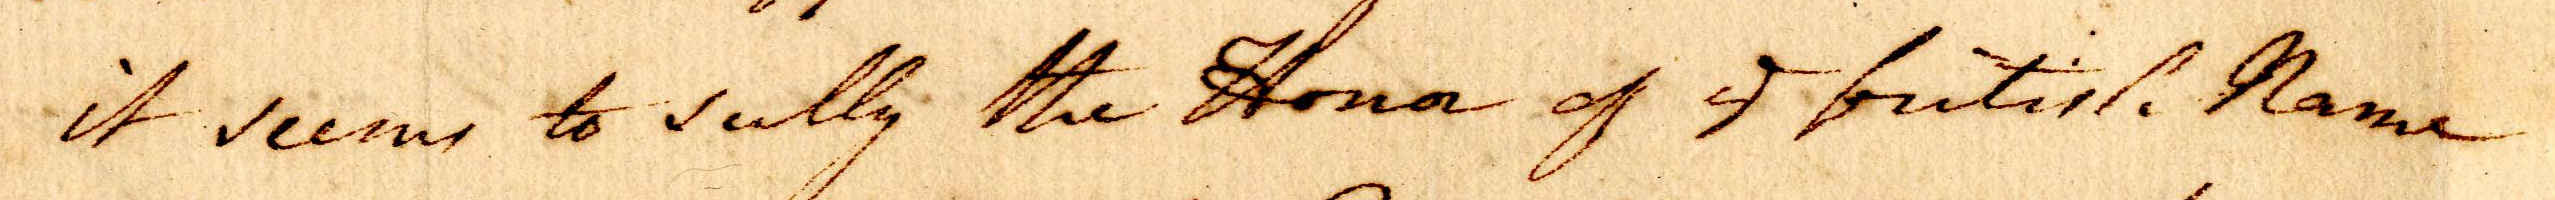it seems to sully the Honor of y^e british Name
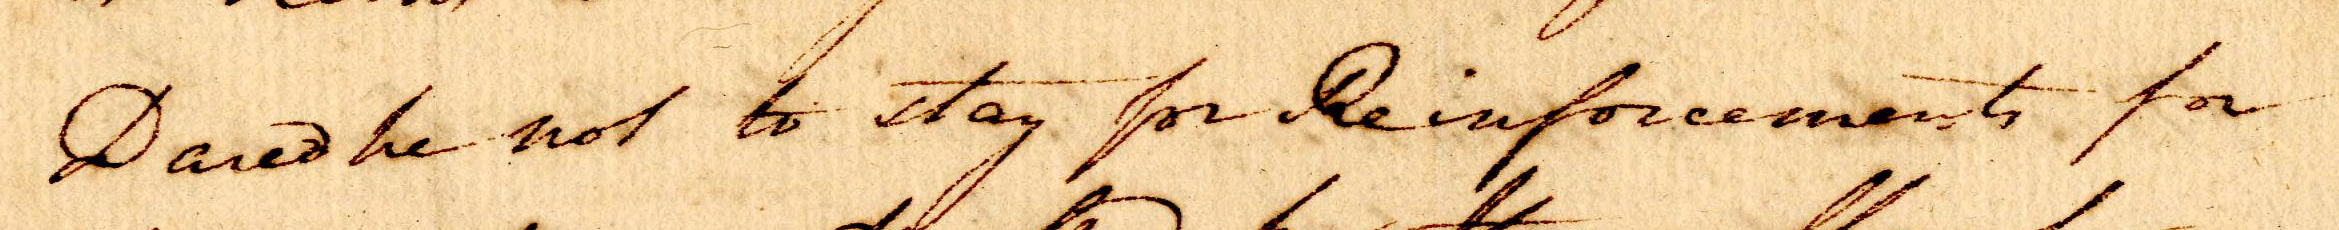Dared he not to stay for Reinforcements for
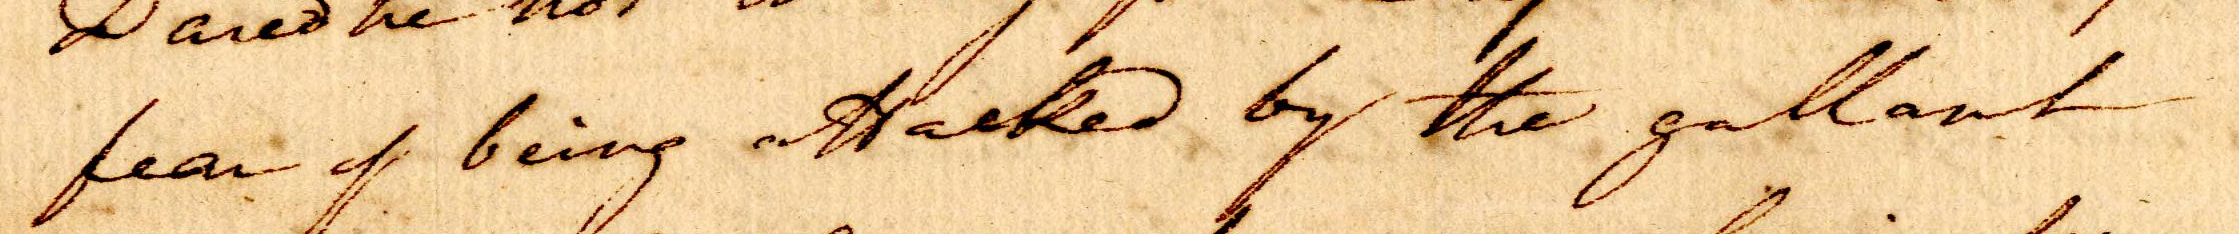fear of being attacked by the gallant
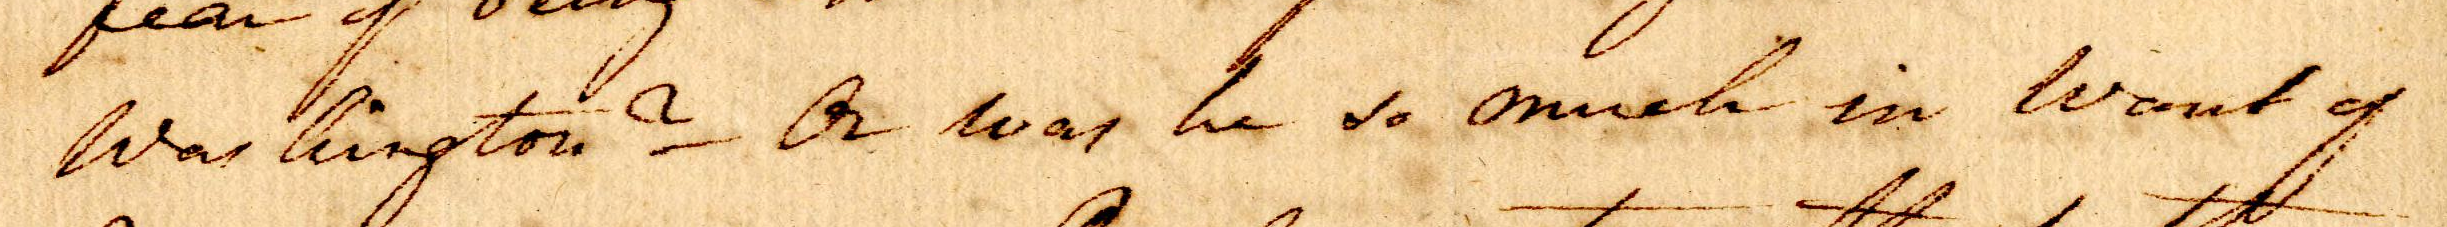Washington? Or was he so much in Want of
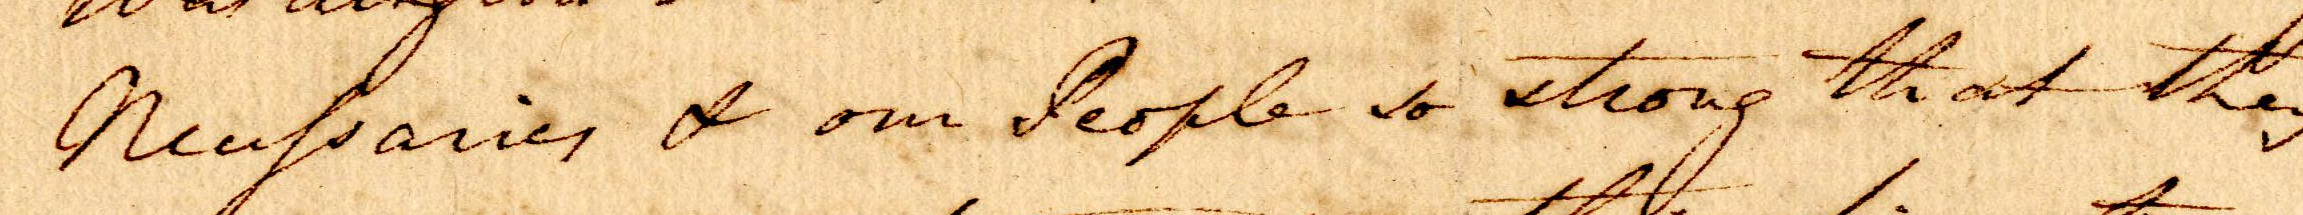Necessaries & our People so strong that they
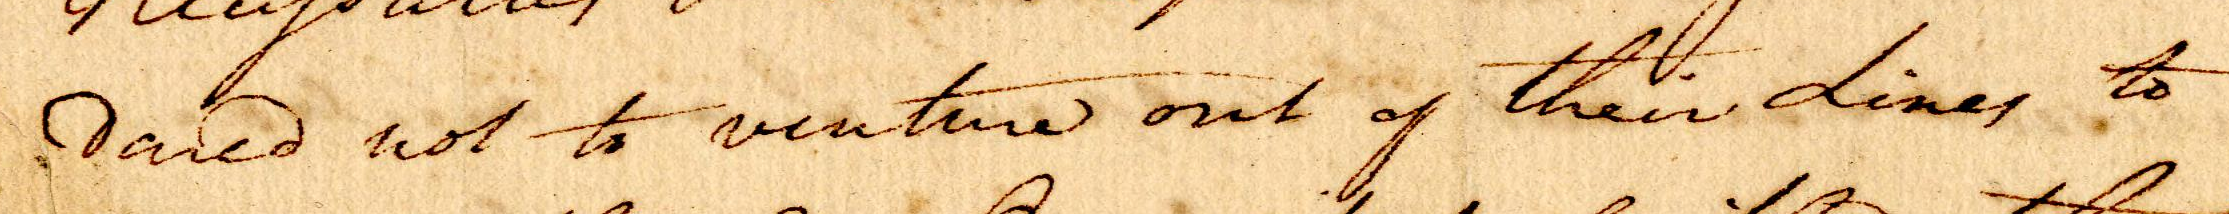dared not to venture out of their Lines to
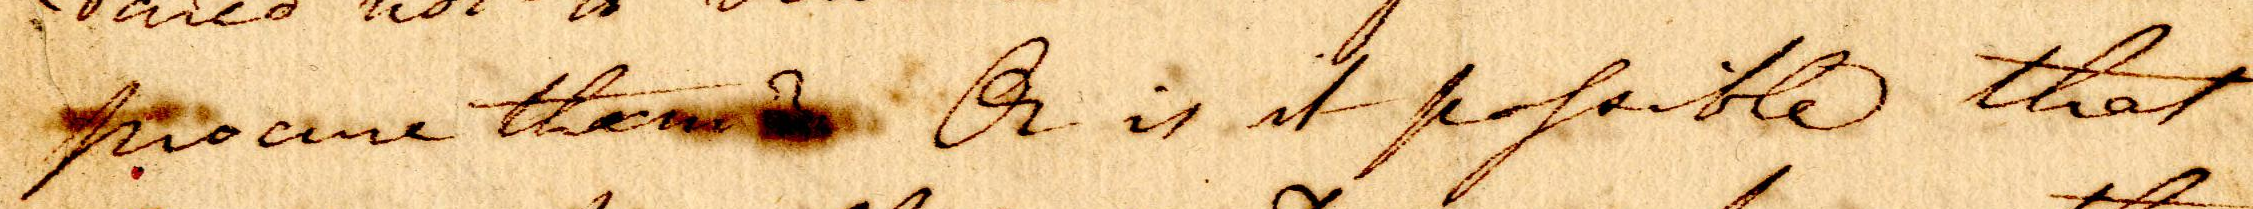procure them? Or is it possible that
